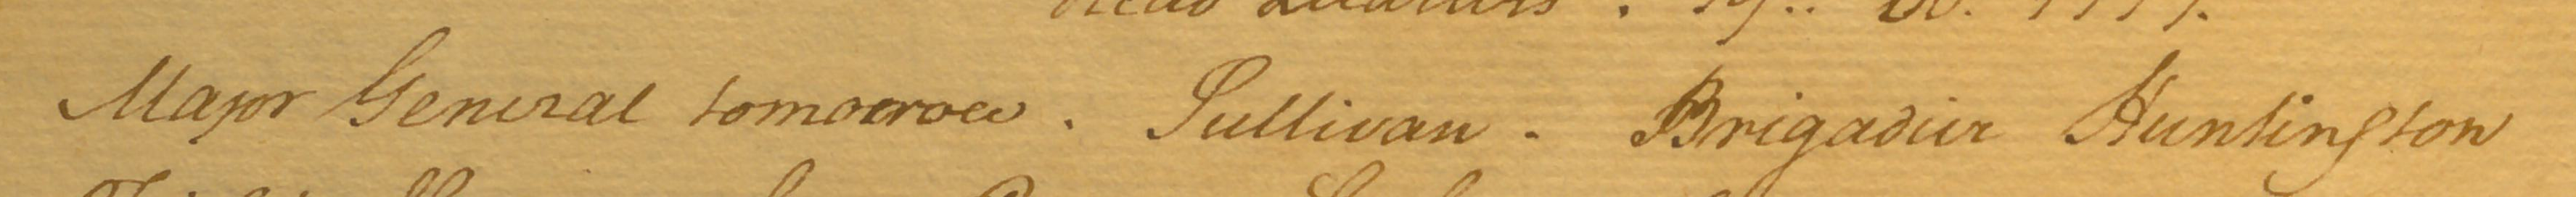Major General tomorrow. Sullivan. Brigadier Huntington
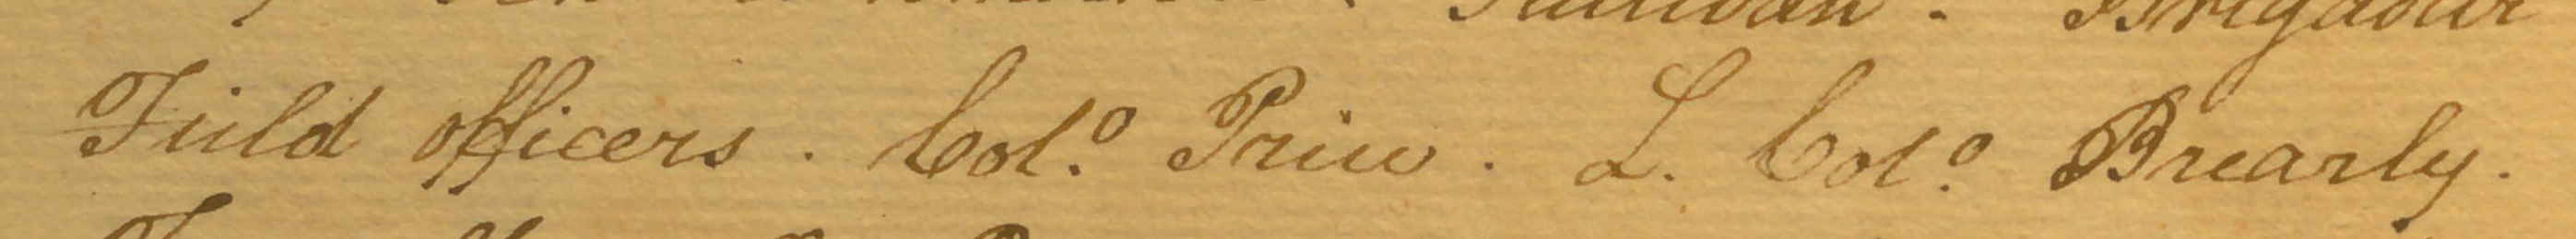Field officers. Col^o. Price. L. Col^o. Brearly.
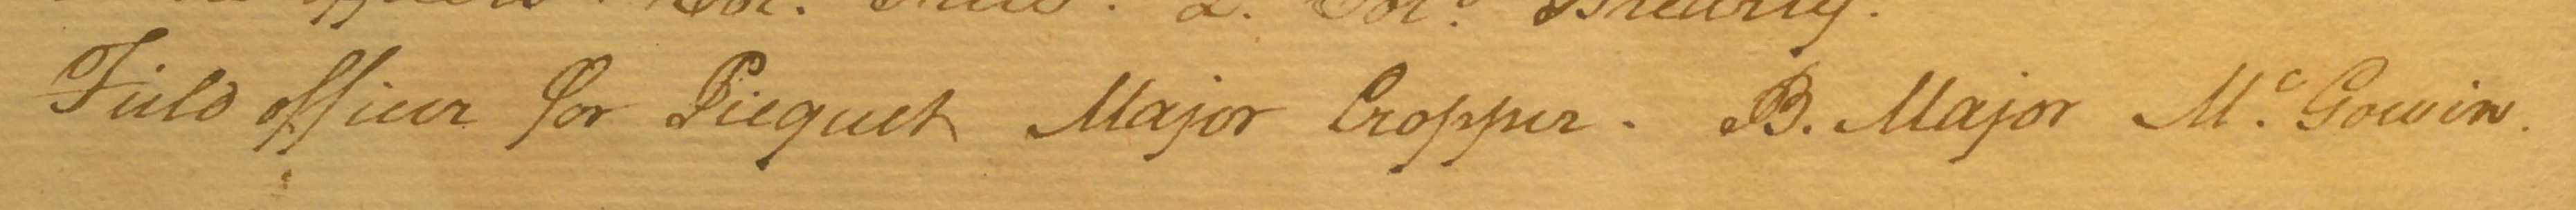Field officer for Picquet Major Cropper. B. Major M^c. Gowin.
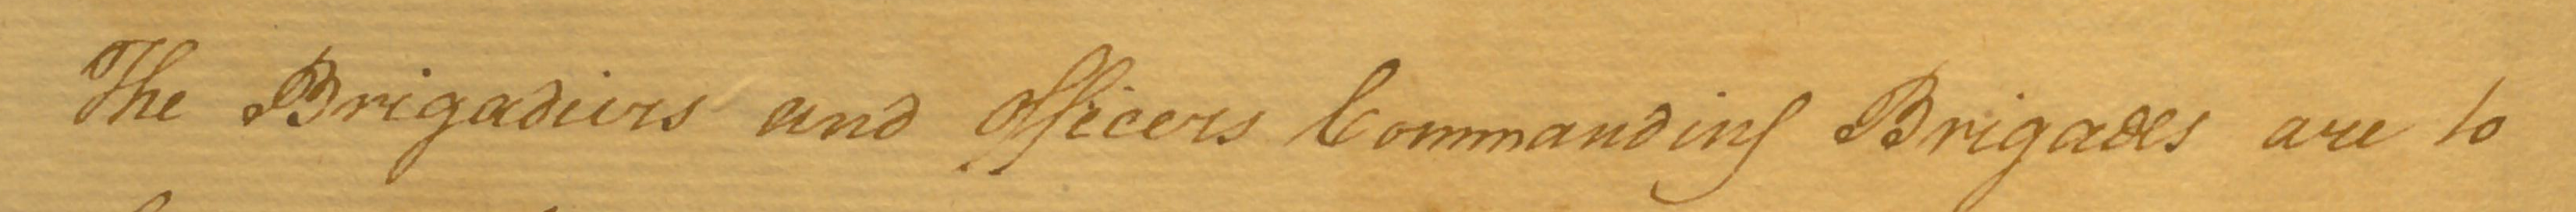The Brigadiers and officers Commanding Brigades are to
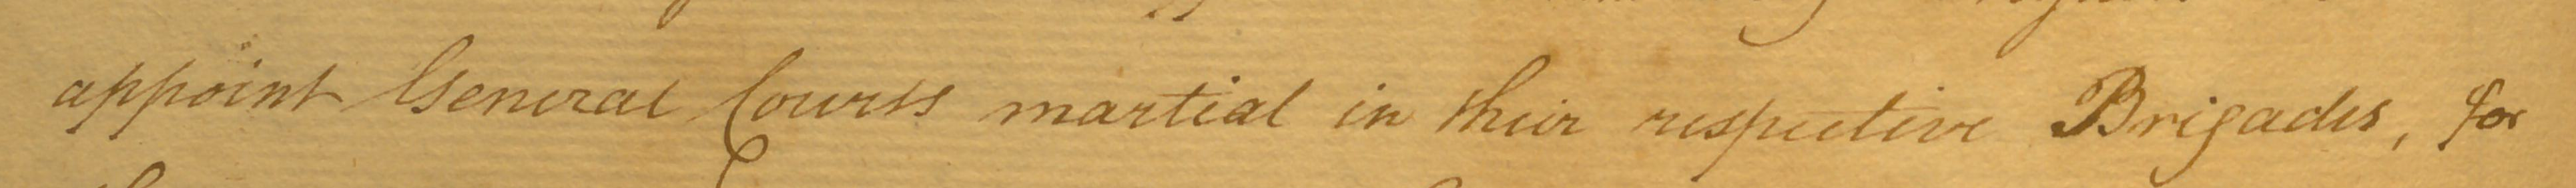appoint General Courts martial in their respective Brigades, for
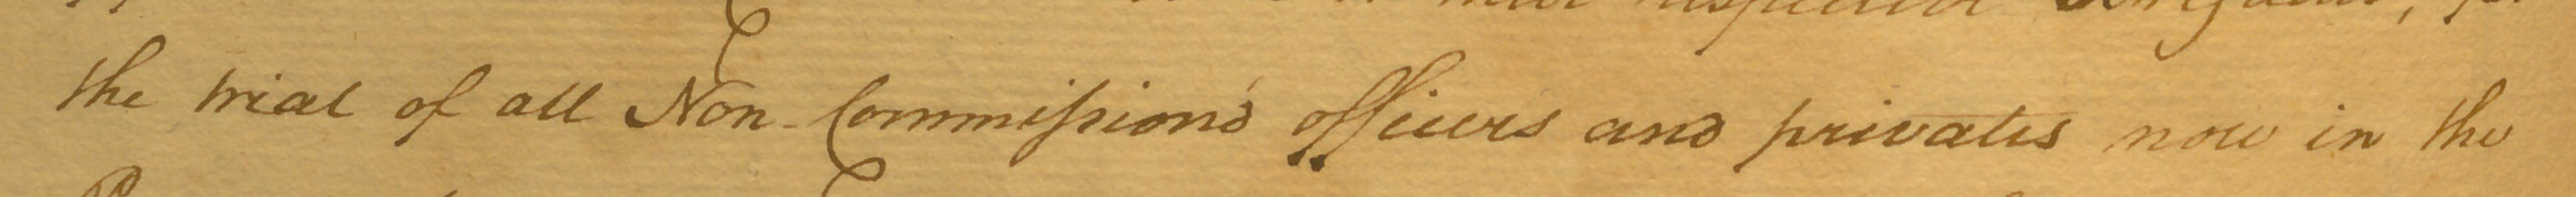the trial of all Non-Commission'd officers and privates now in the
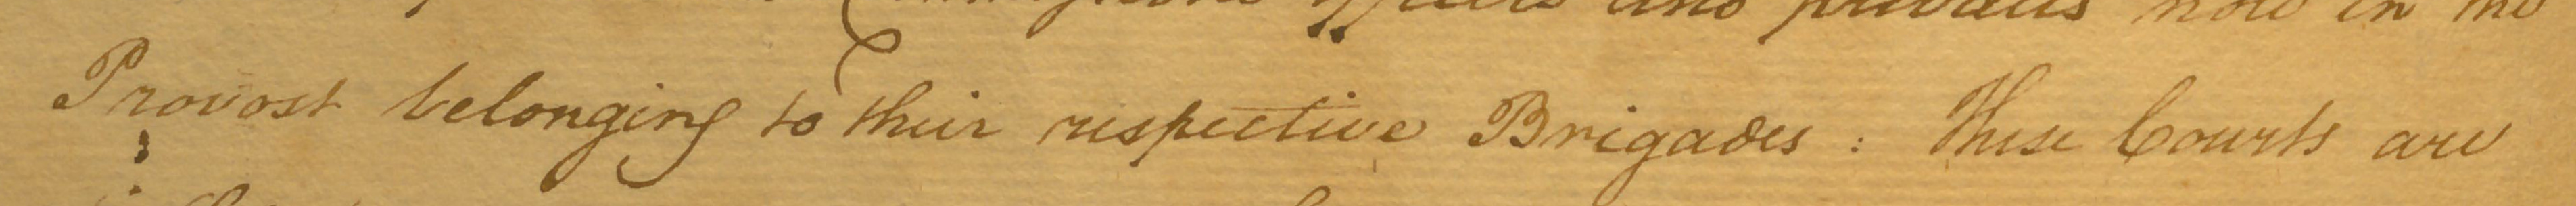Provost belonging to their respective Brigades: These Courts are
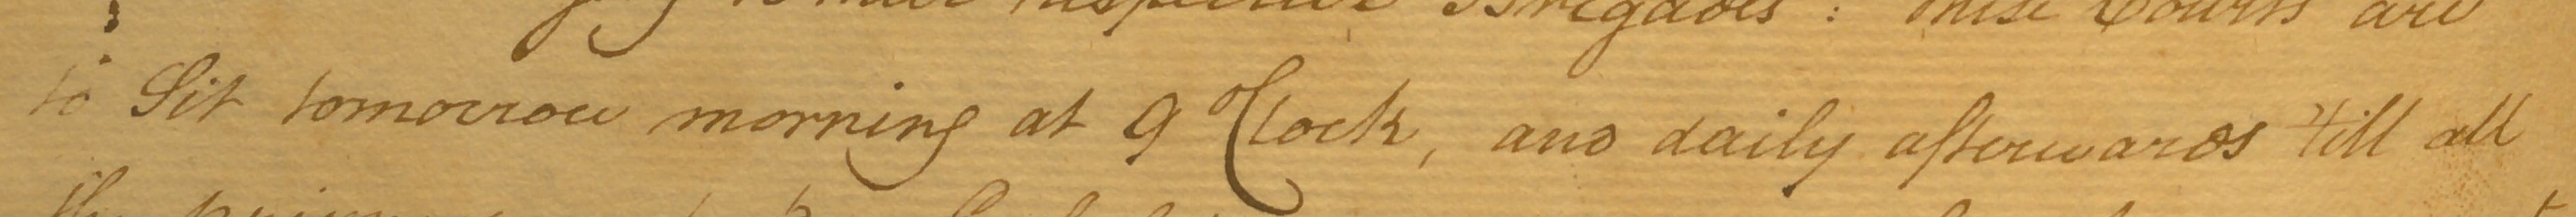to sit tomorrow morning at 9 ^oClock, and daily afterwards 'till all
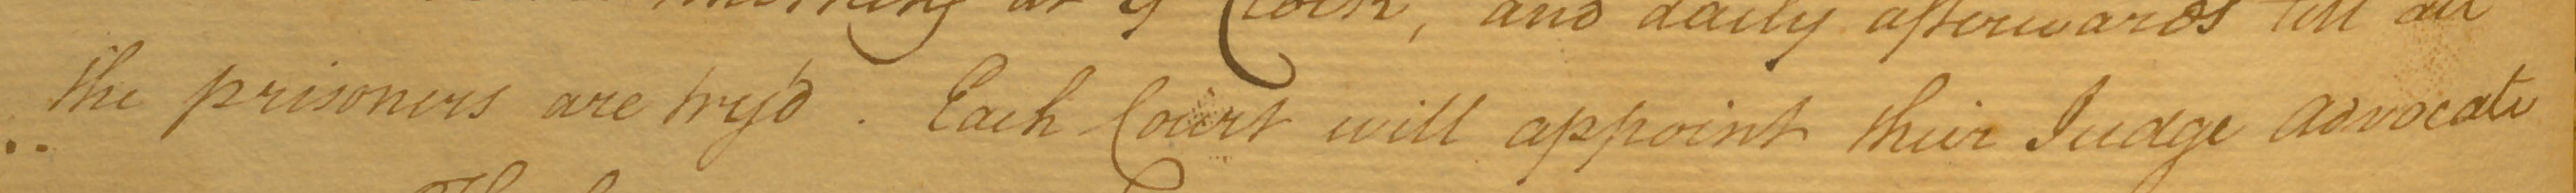the prisoners are try'd. Each Court will appoint their Judge advocate
